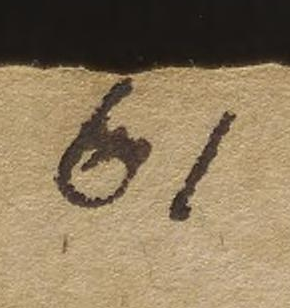61
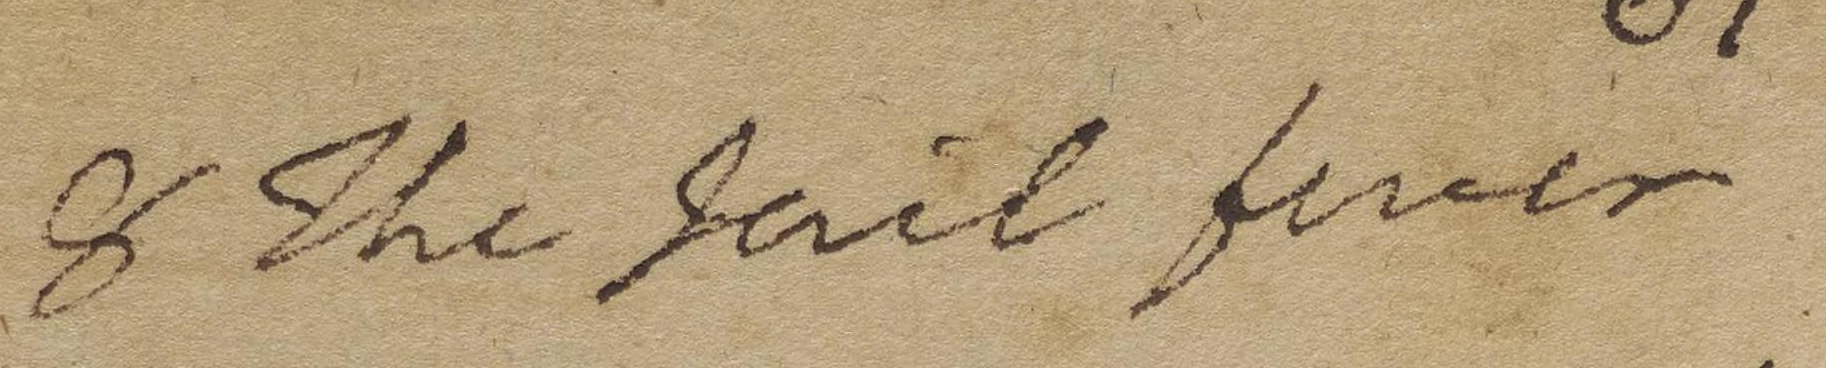8 The Jail fever
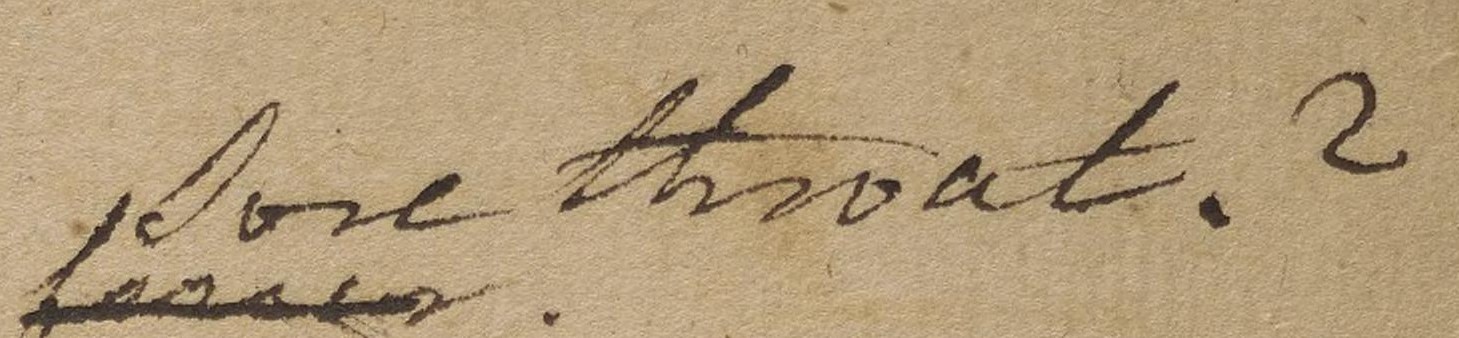Sore throat?
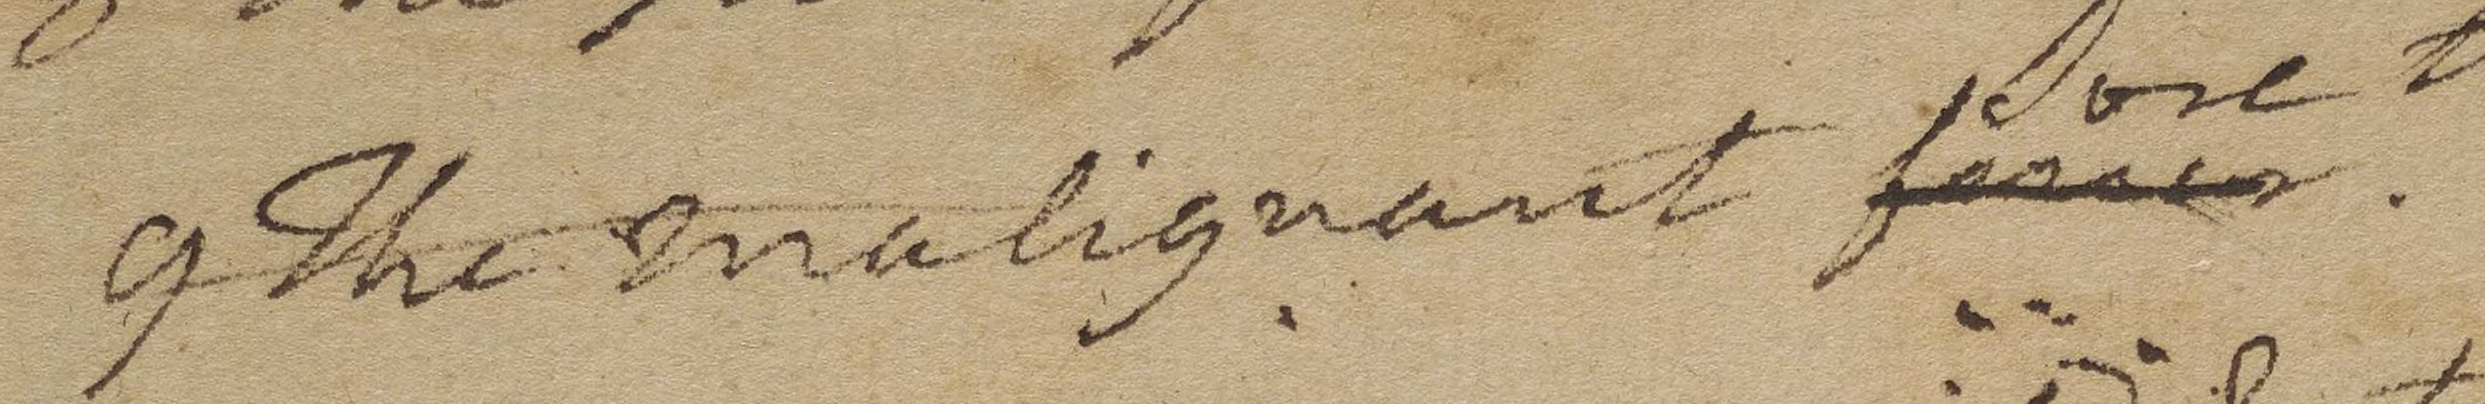9 The malignant [fever].
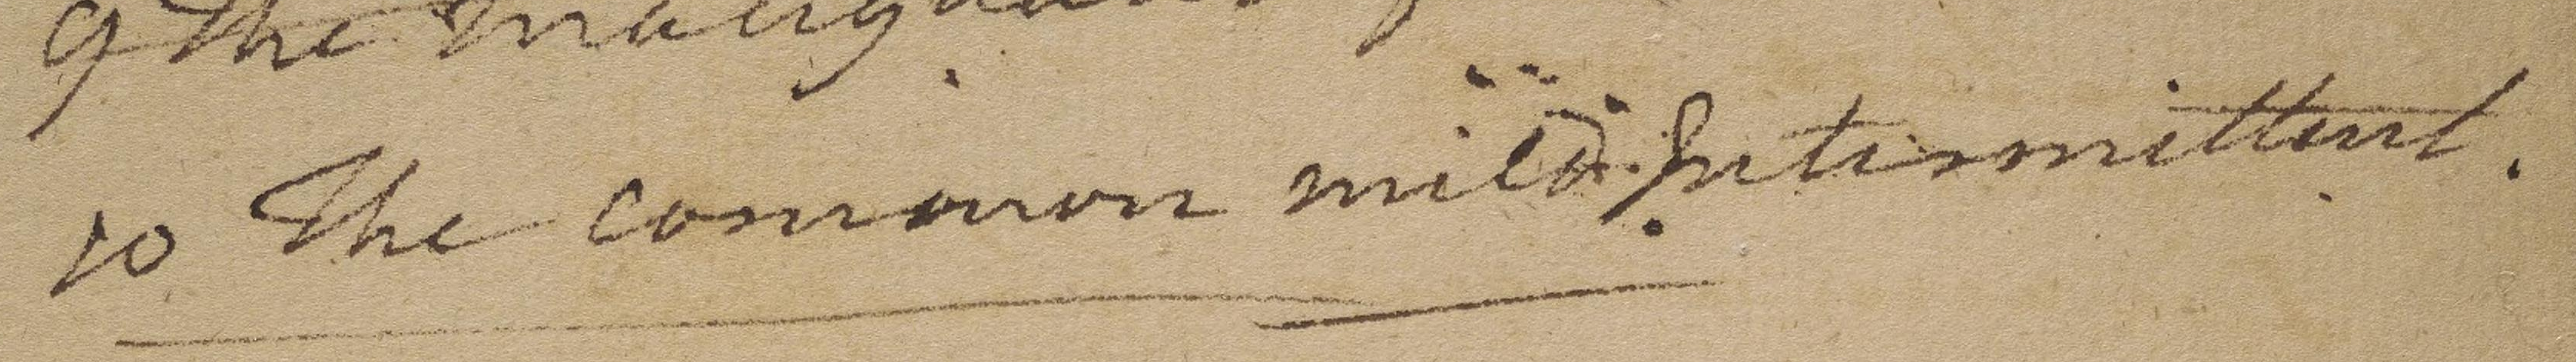10 The common mild intermittent
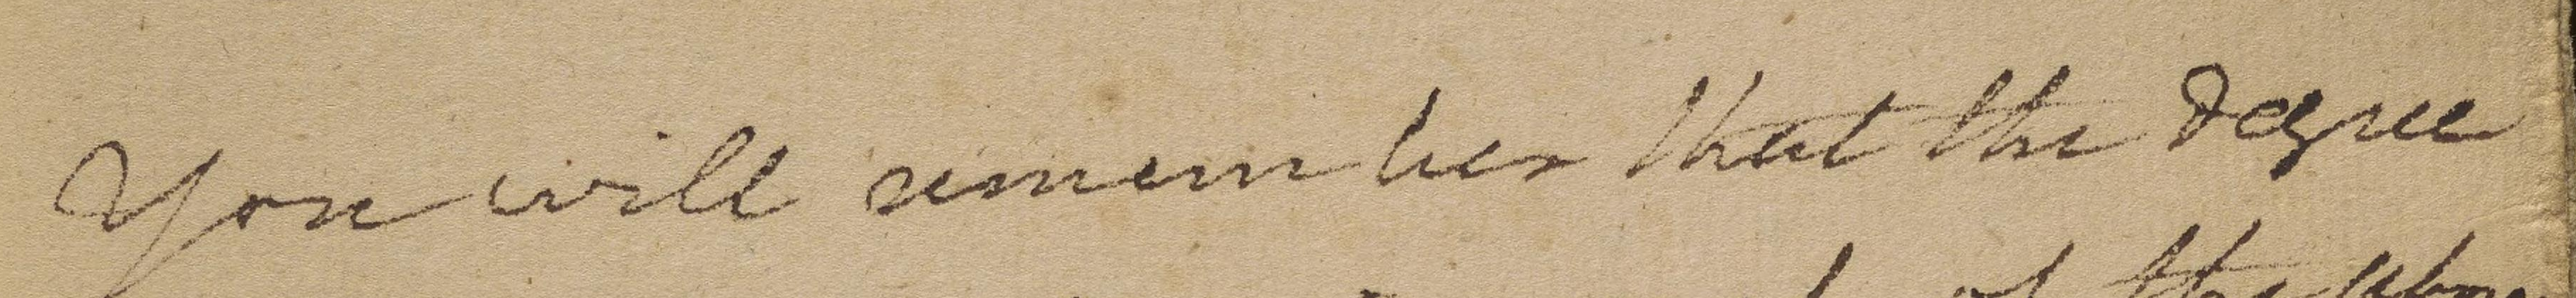You will sense her that the degree
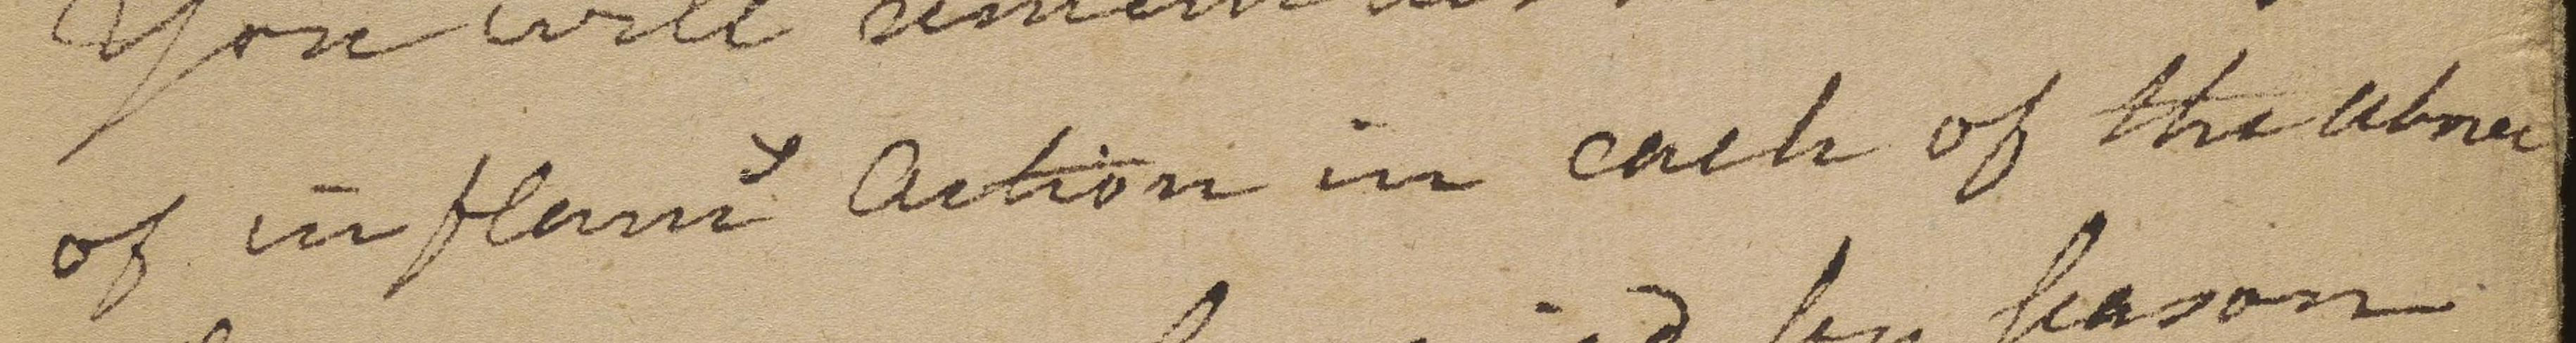of inflam^y Action in each of the above
